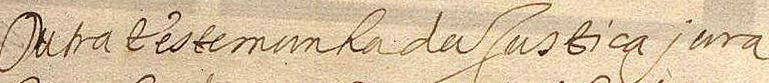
Outra testemunha da Justica jura
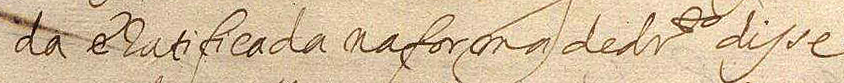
da e Ratificada na forma de drto disse
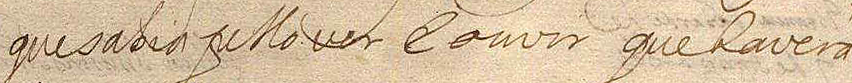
que sabia pello ver e ouvir que haverà
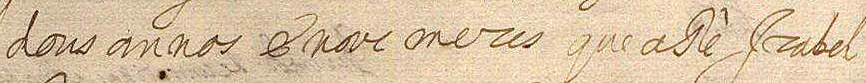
dous annos e nove mezes que a Rè Jzabel
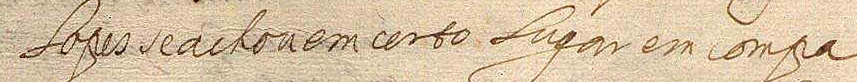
lopes se achou em certo lugar em compa
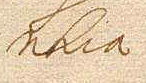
nhia
